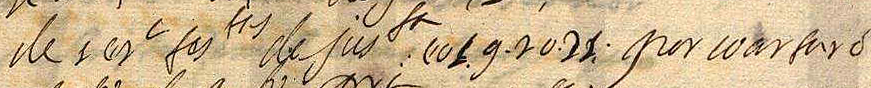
de 1 e 2a testas de Justa : e o 19. 20. 21. por coartarē
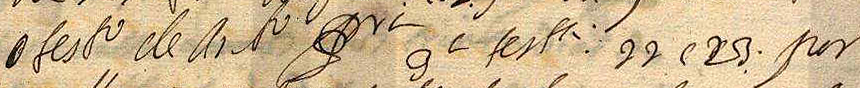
o testo de Anto Pra 9a testa. 22 e 23. por
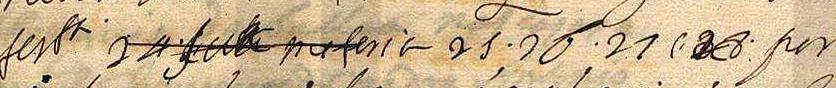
testa 24 seuta materia 25. 26. 27 e 28. por
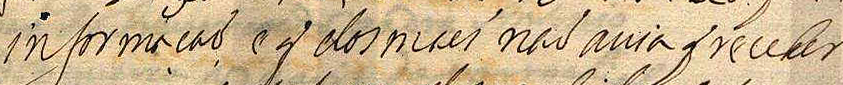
informacaõ, e q̄ dos mais naõ auia q̄ receber
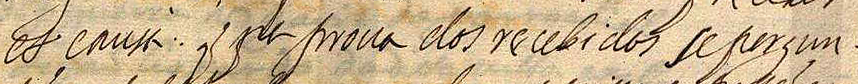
ex causa. q̄ pa proua dos recebidos se pergun
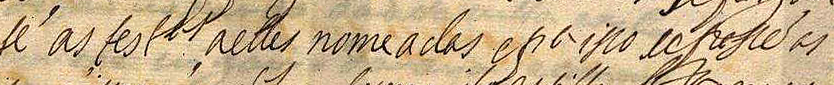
tē as testas a elles nomeadas e pa isso se passē as
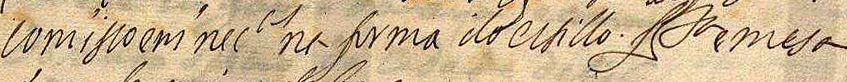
comissoens necas na forma do estillo. fta e mesa
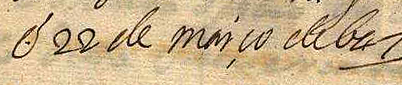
ē 22 de março de 647
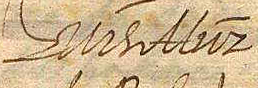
Luis Aluz̄
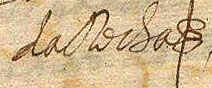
da Rocha
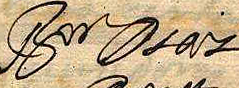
Bor Diaz
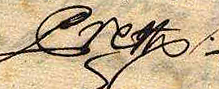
Pretto
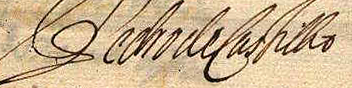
Pedro de Castilho
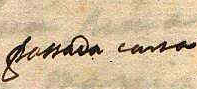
passada carta
